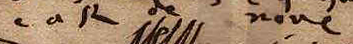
e a R de noue
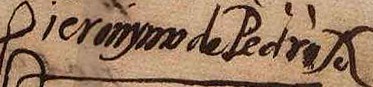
Hieronymo de Pedroso
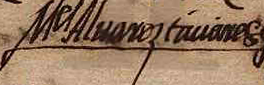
Mel Aluarez tauares
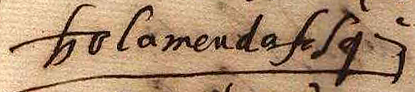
b̄olameu dafosq
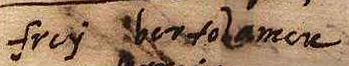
frey bertolameu
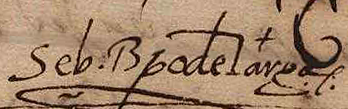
Seb. Bpō de Targa
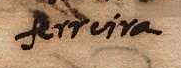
ferreira
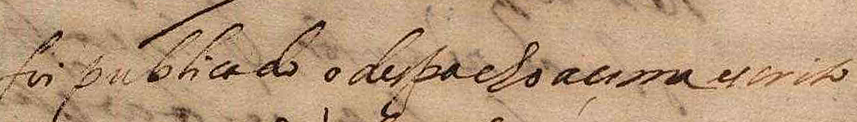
foi publicado o despacho acima escrito
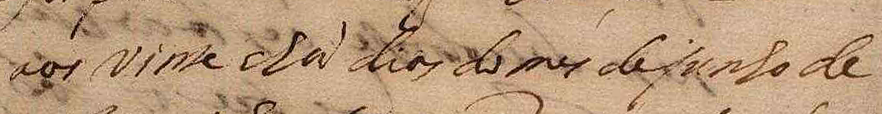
aos vinte E hū dias do mes de junho de
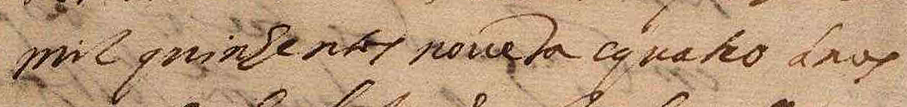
mil quinhentos nouēta e quatro an̄os
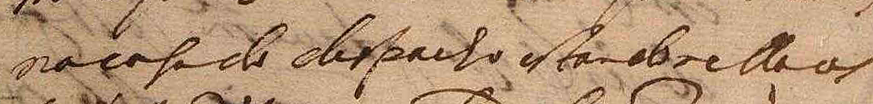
na casa do despacho estando nella os
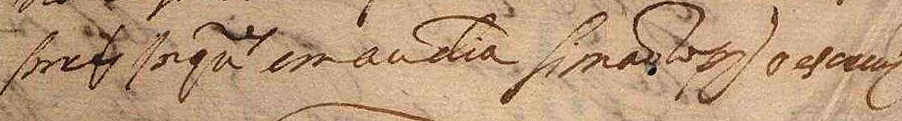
snrēs Jnqures em aud̄ia simaõ lopz̄ o escreuj
